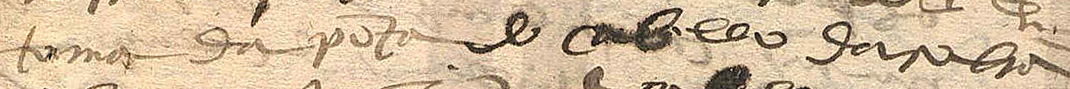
toma da pōta do cabello da sobrā
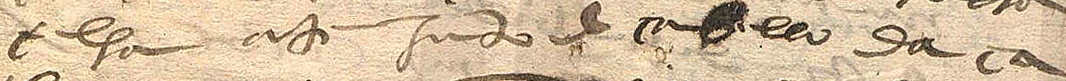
celha ate Jūto de cabello da ca
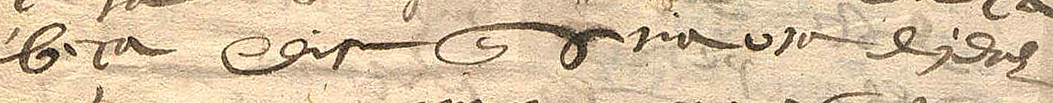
beça e dise q̄ seria ora de jdade
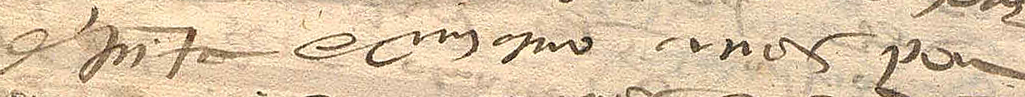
de trīta e cimquo anos pou
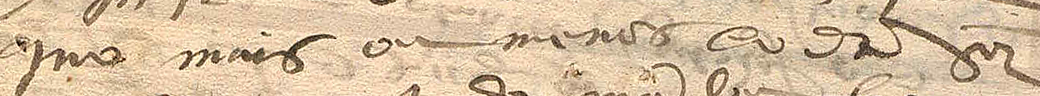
quo mais ou menos e o dtō sōr
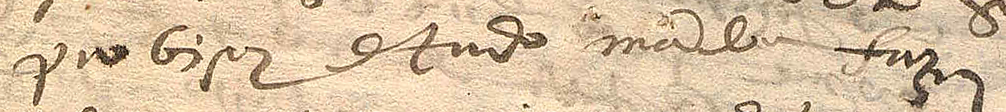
provisor de tudo mādou fazer
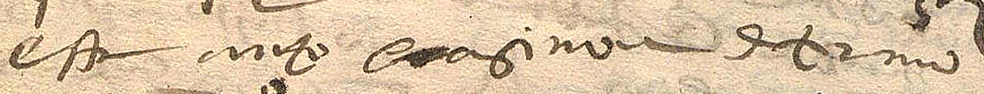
este auto e o asinou de termo
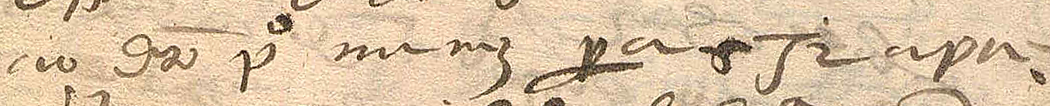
ao dit̄o po nunez ꝑa se Jr apre
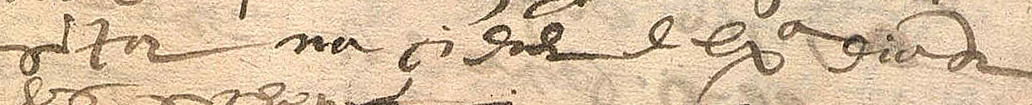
sētar na cidade de lxa diāte
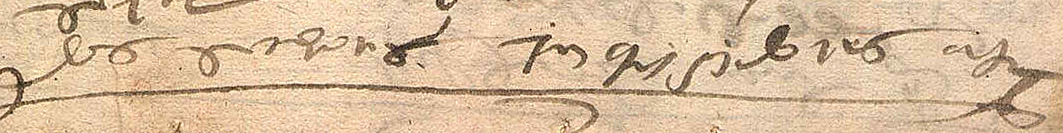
dos senhores jmqujsidores ate
